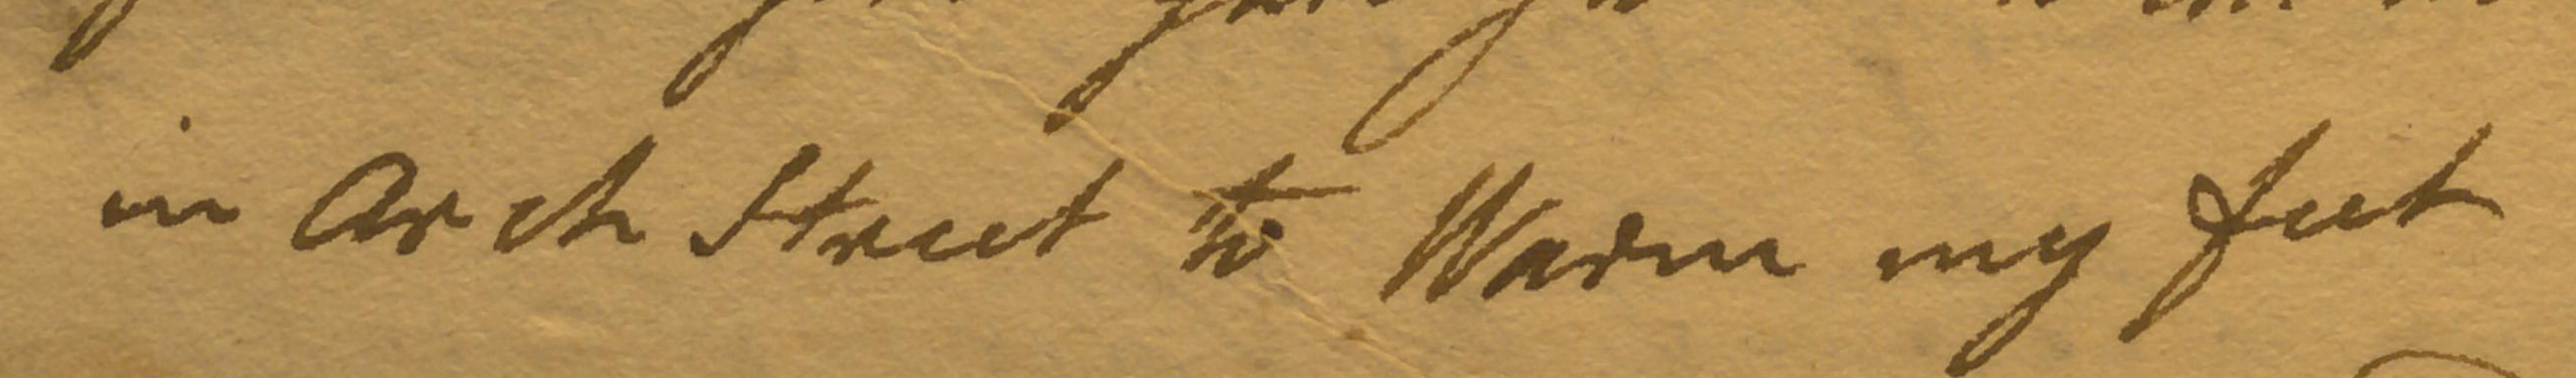in Arch Street to Warm my feet
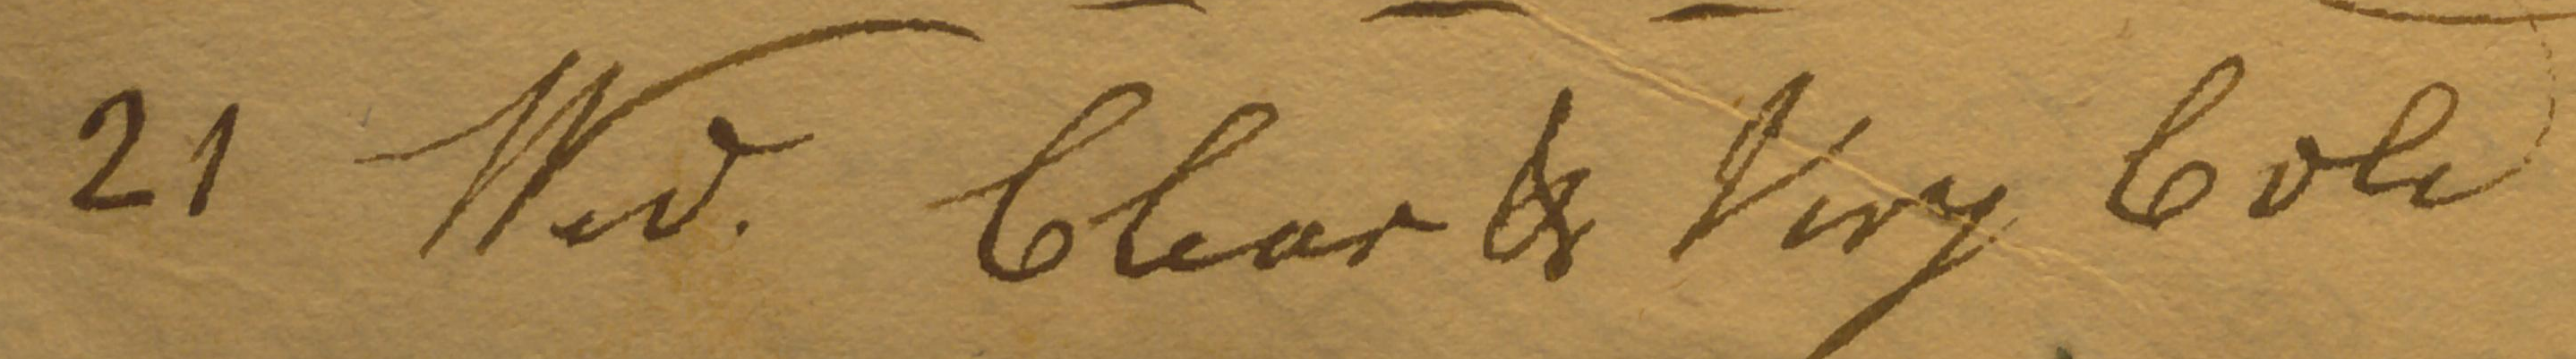21 Wed. Clear & Very Cold
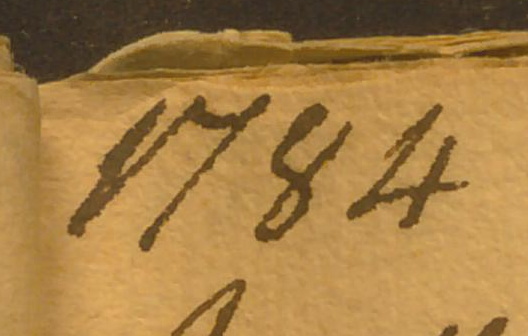1784
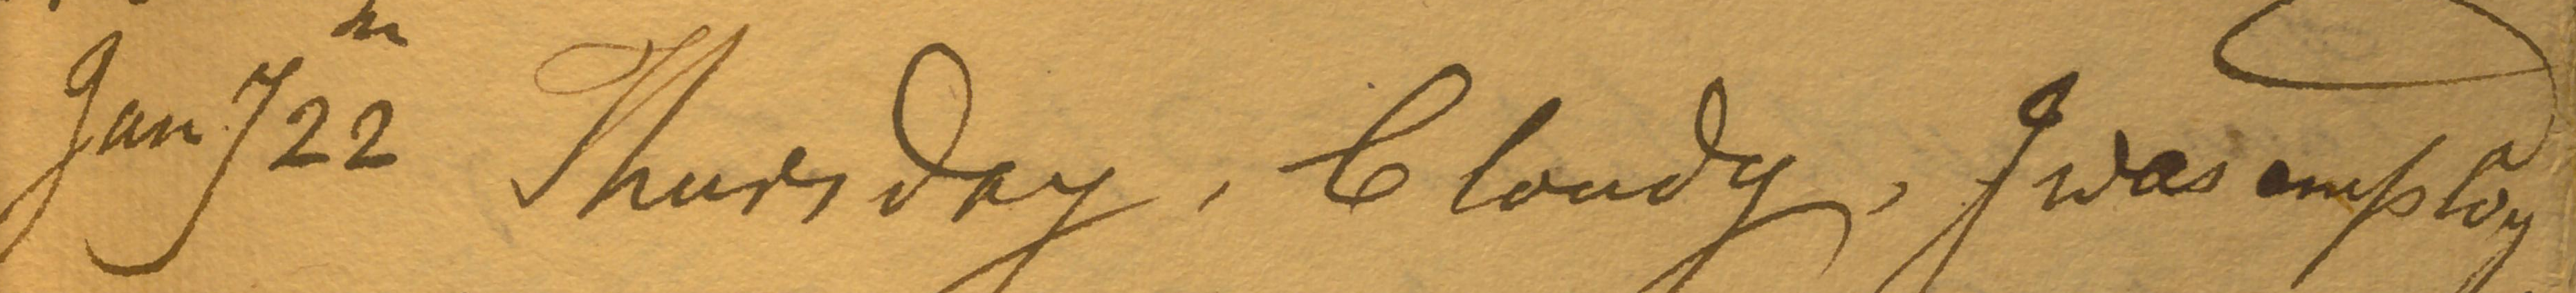Jan^y 22 Thursday Cloudy I was employ^d
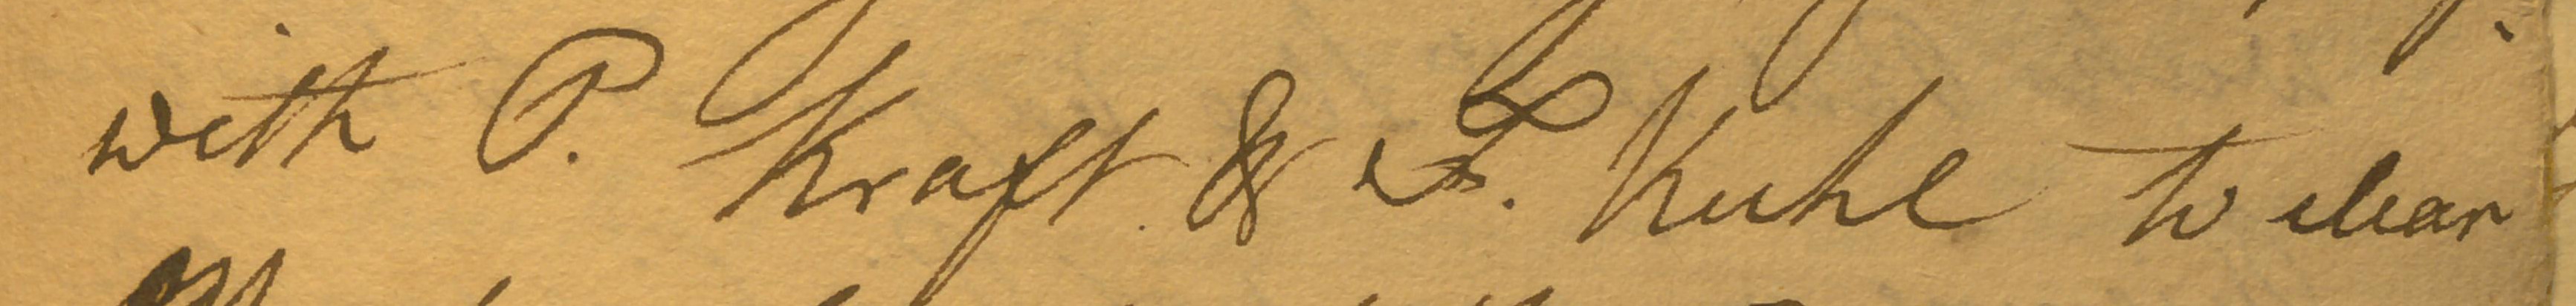with P. Kraft & F. Kuhl to clear
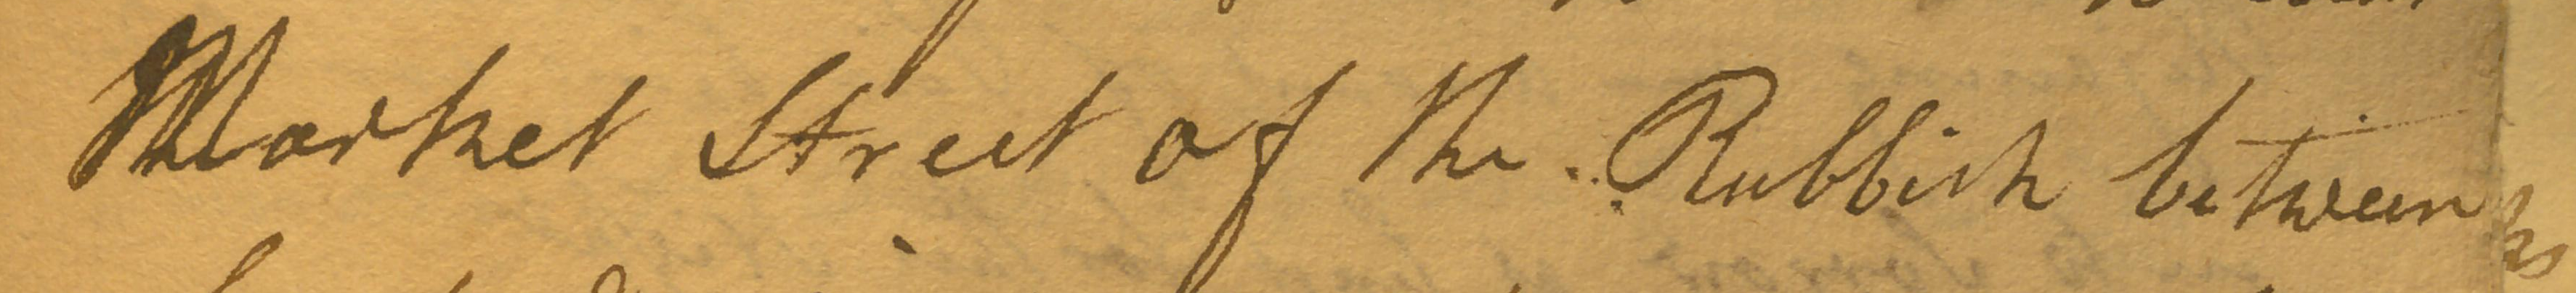Market Street of the Rubbish between
